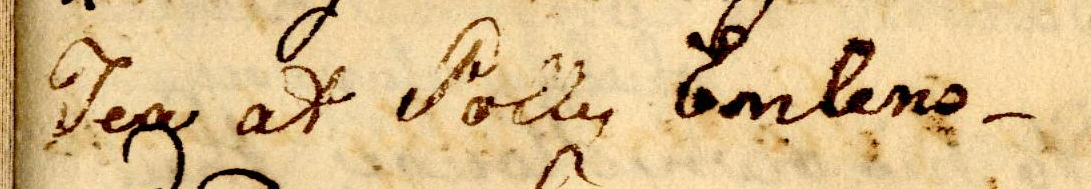Tea at Polly Emlens-
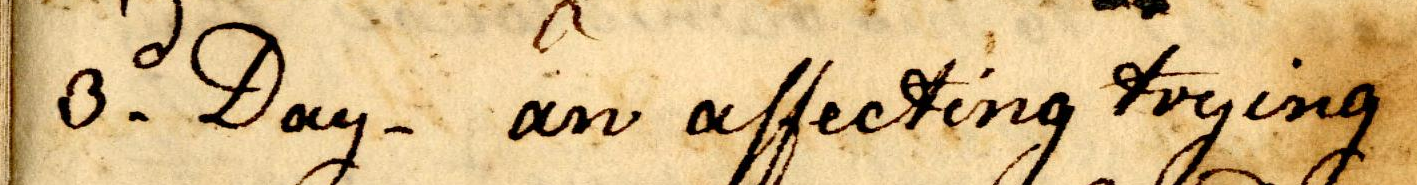3^d. Day- an affecting trying
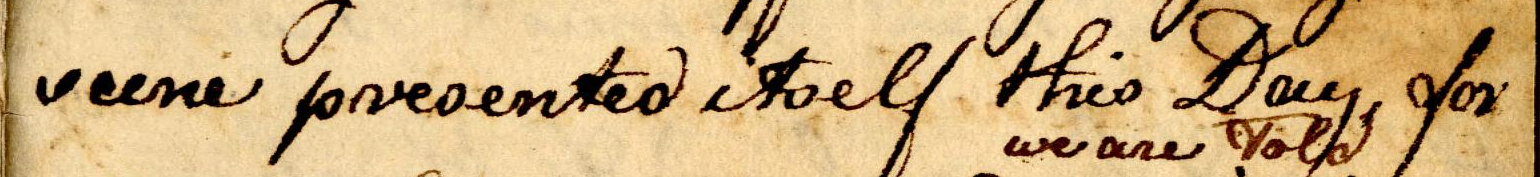scene presented itself this Day for
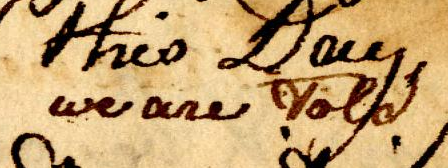we are told
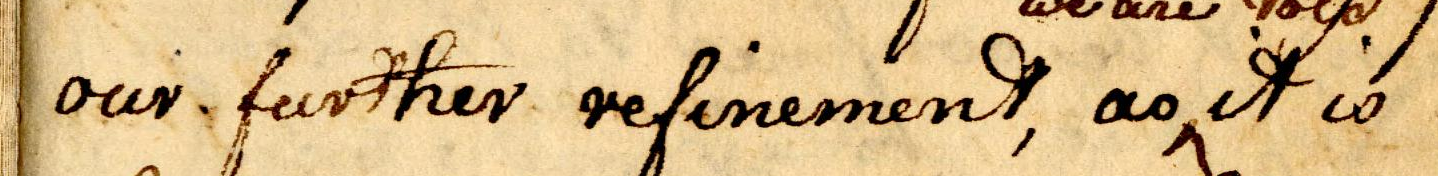our further refinement, as ^ it is
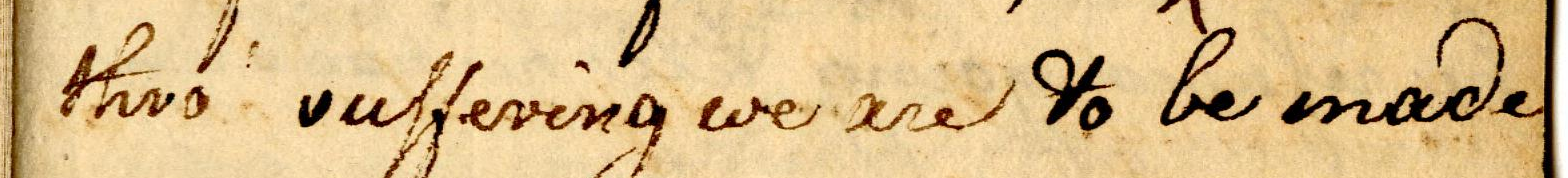thro' suffering we are to be made
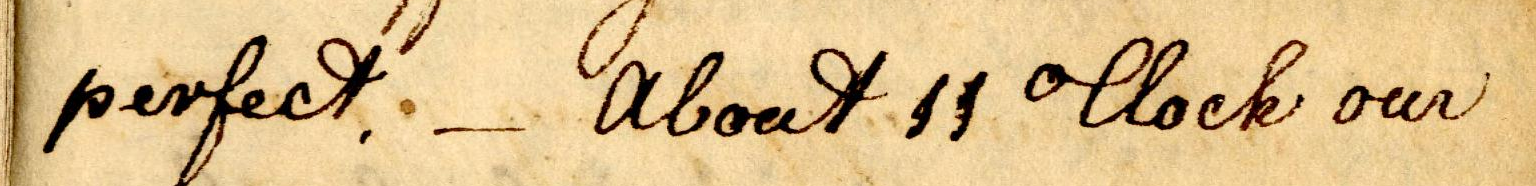perfect,- About 11 ^oClock our
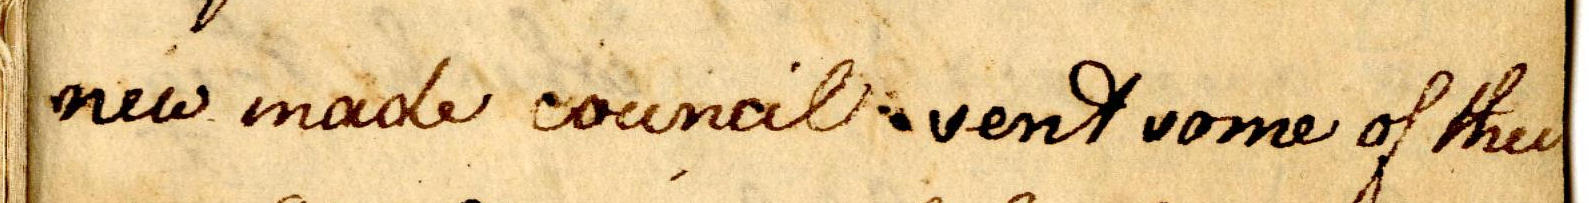new made council sent some of thee
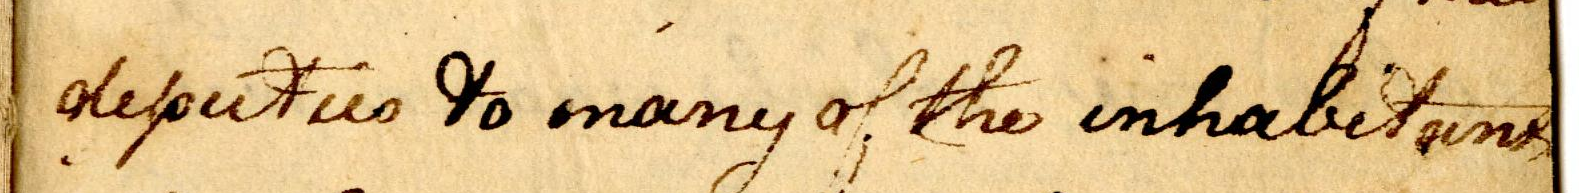deputies to many of the inhabitants
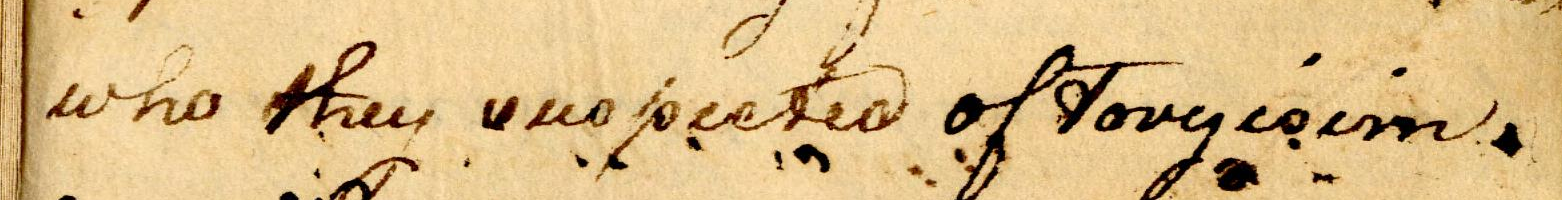who they suspected of Toryisim
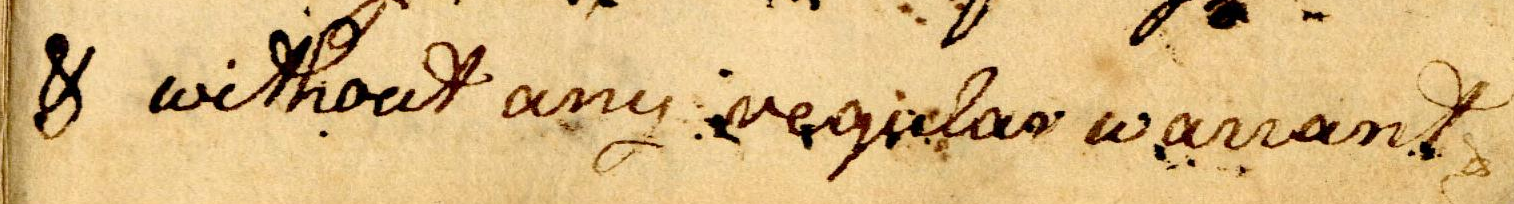& without any regular warrant
